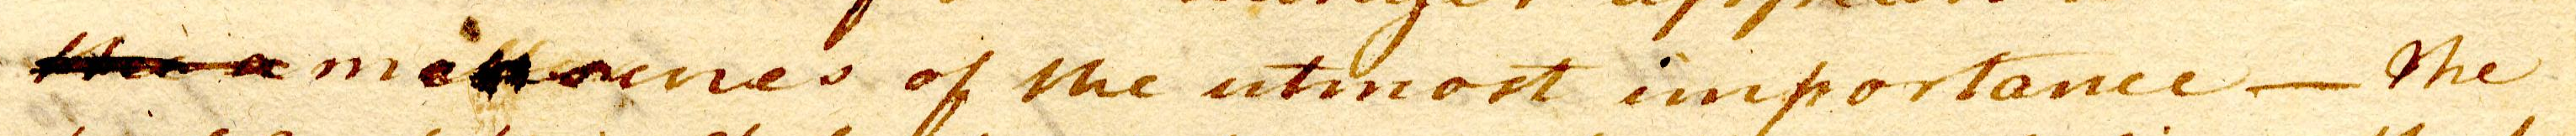[____] measures of the utmost importance- the
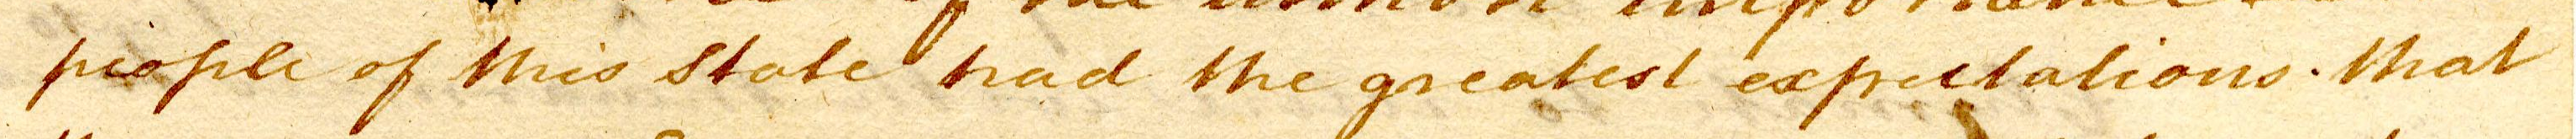people of this state had the greatest expectations that
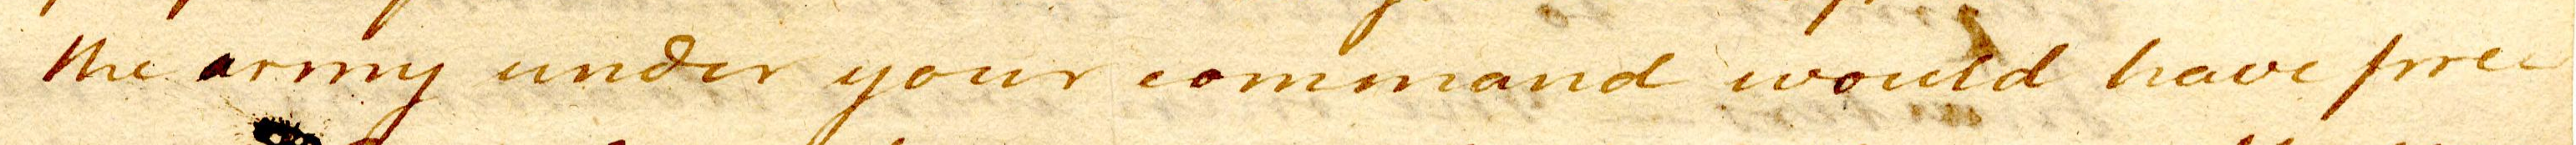the army under your command would have pre-
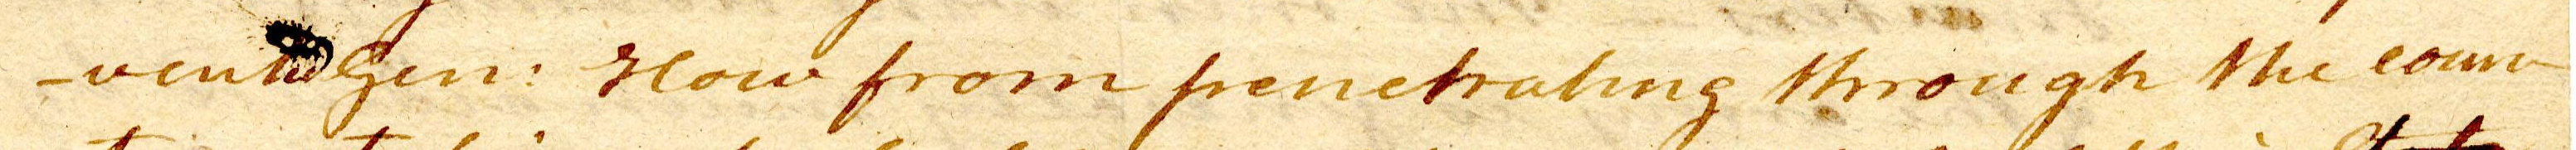-vented Gen: How from penetrating through the coun-
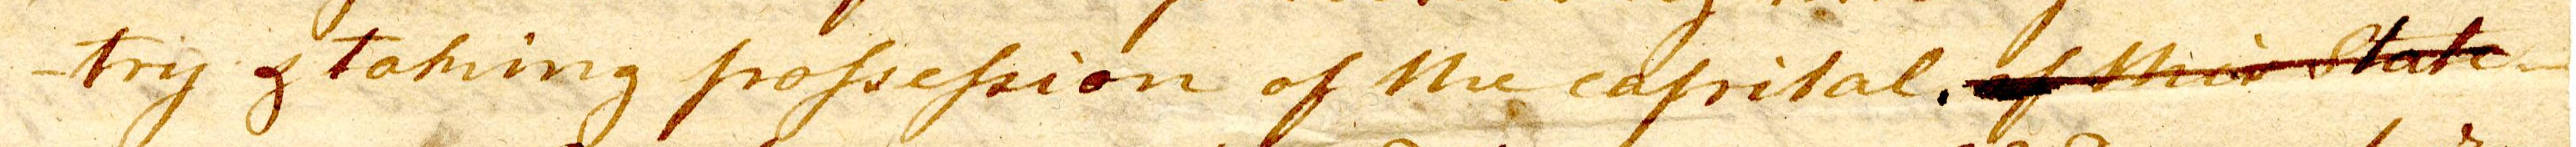-try & taking possession of the capital, [of their State]
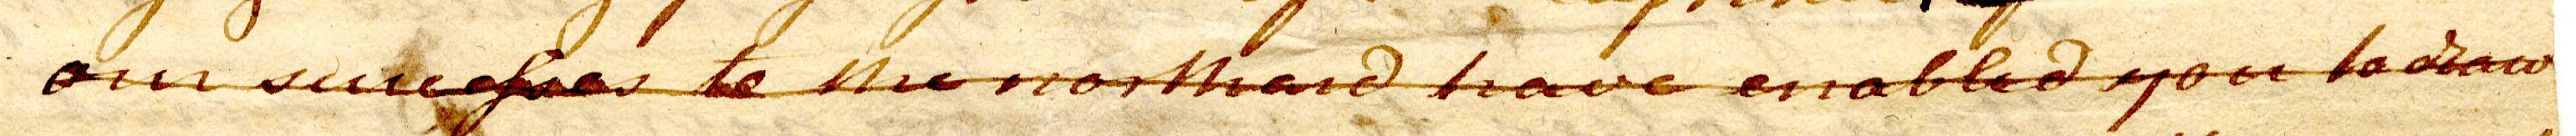[our successes to the northard have enabled you to draw]
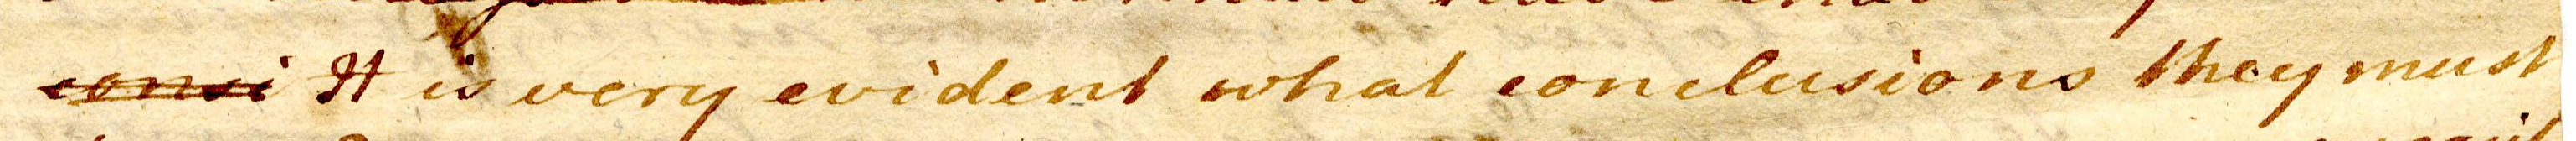[consi] It is very evident what conclusions they must
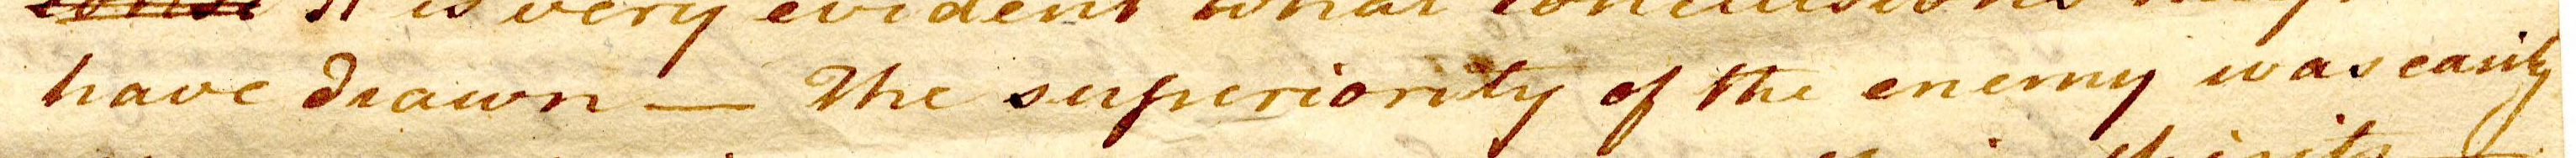have drawn- The superiority of the enemy was easily
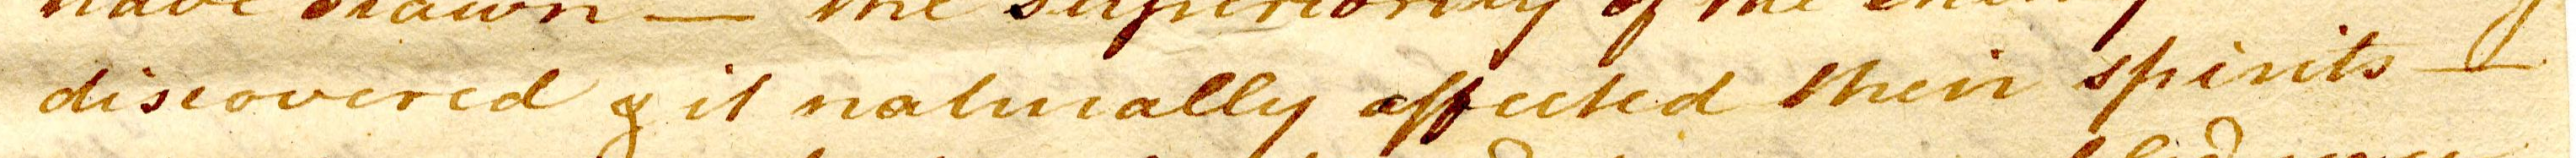discovered & it naturally affected their spirits-
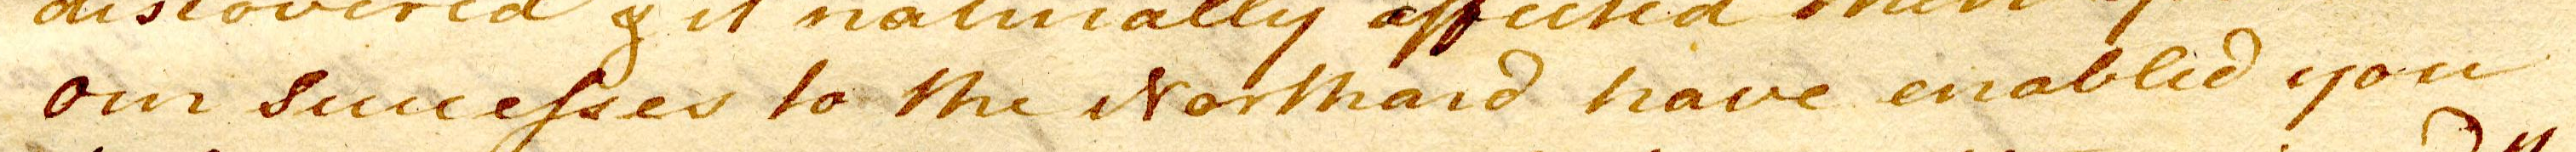Our succcesses to the Northard have enabled you
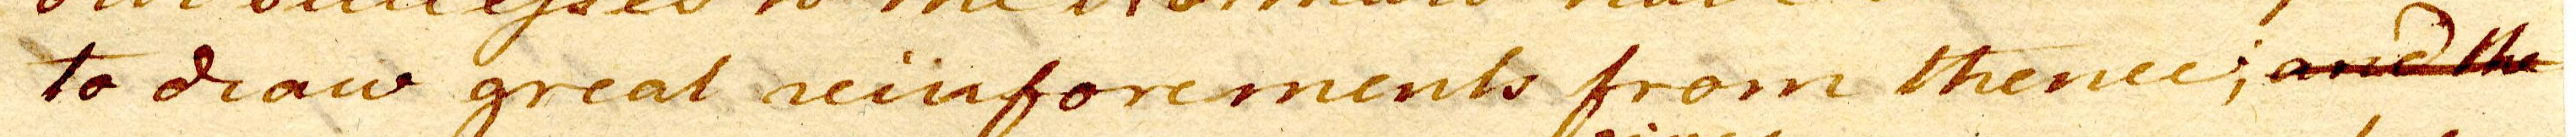to draw great reinforements from thence; [and the]
